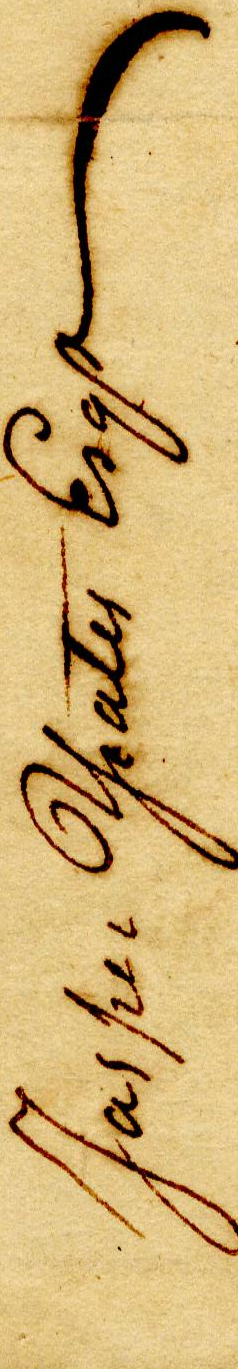Jasper Yeates Esq^r
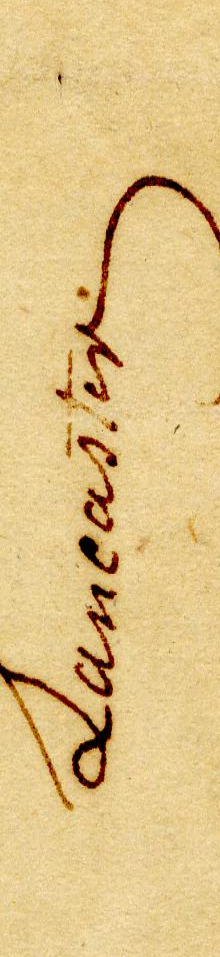Lancaster
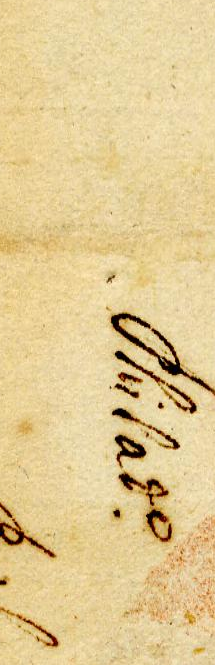Philad^a.
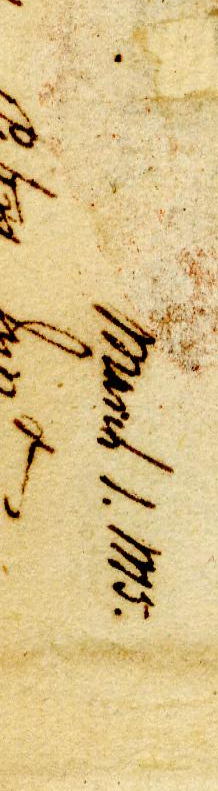March 1. 1775.
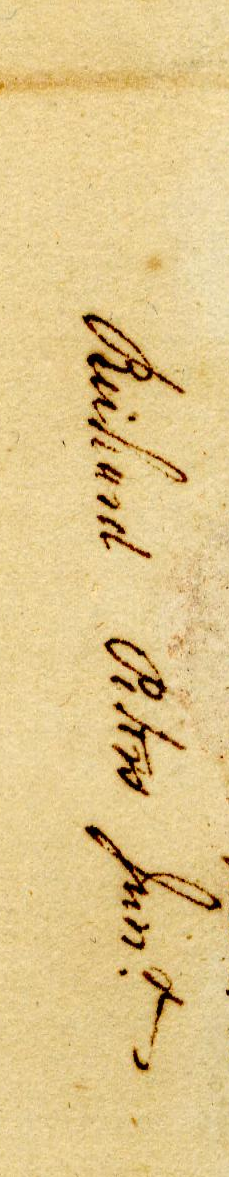Richard Peters Jun^r.
